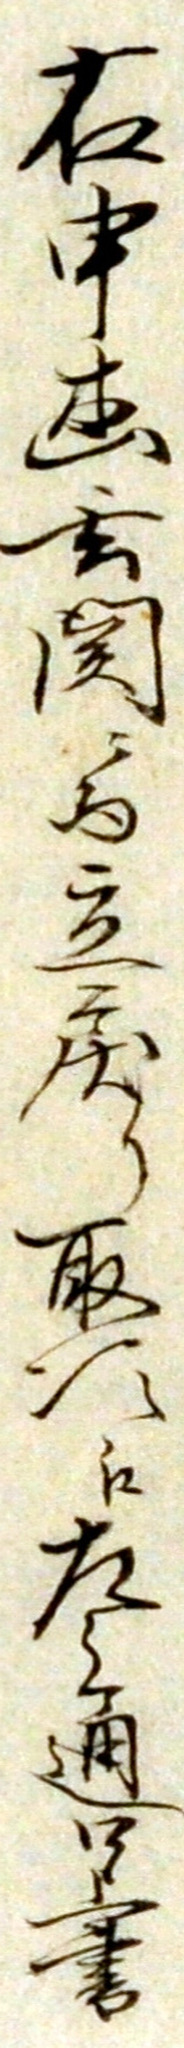右申述玄関ニ而立戻り取次え左之通口上書
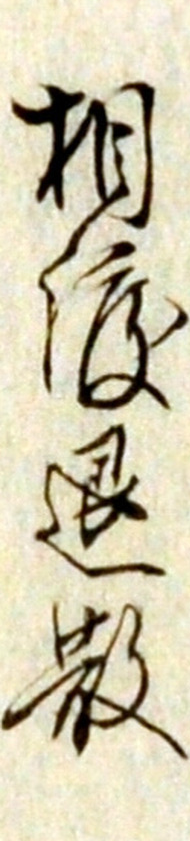相渡退散
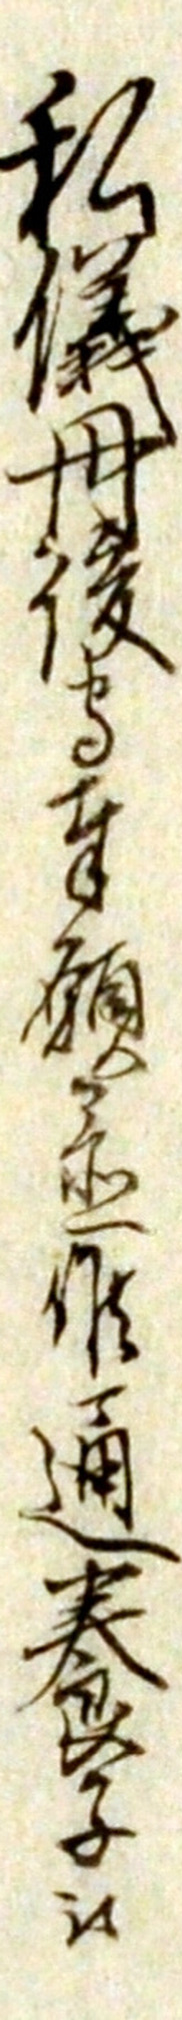私儀丹後守奉願置候通養子被
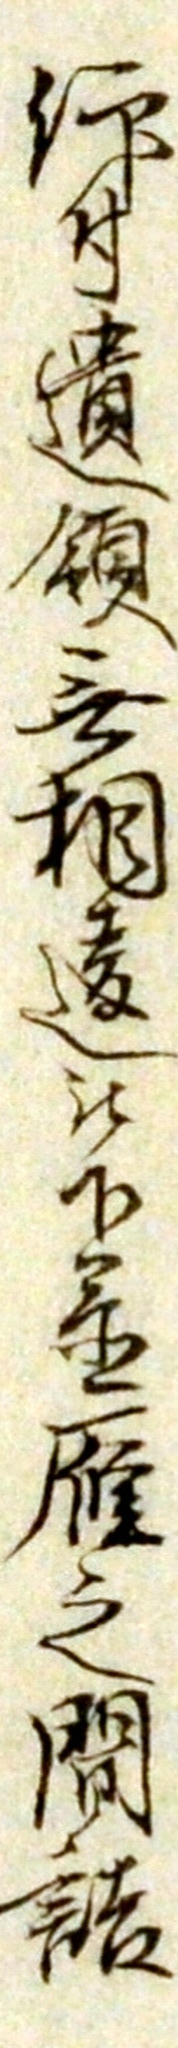仰付遺領無相違被下置雁之間詰
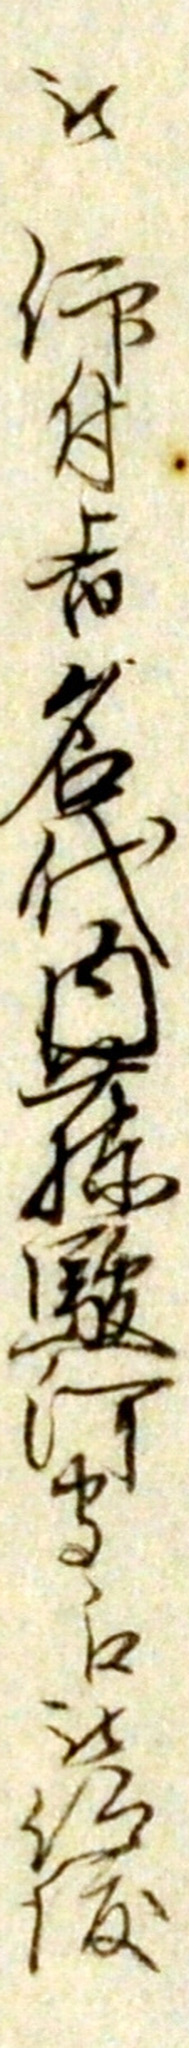被仰付旨名代内藤駿河守え被仰渡
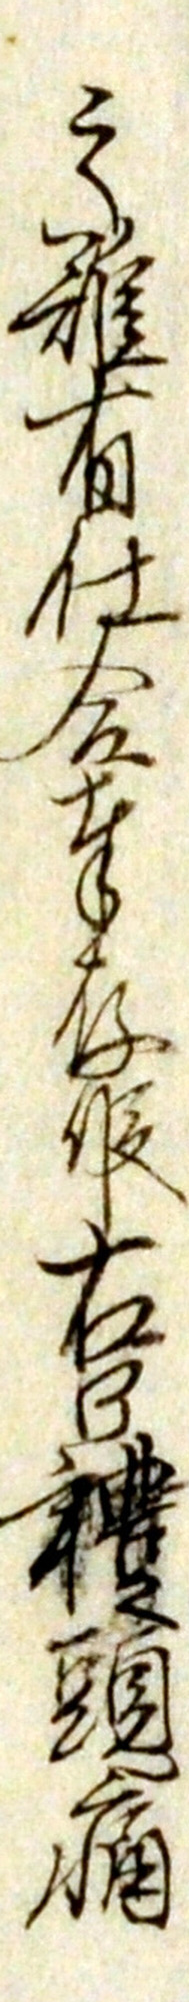之難有仕合奉存候右御礼頭痛
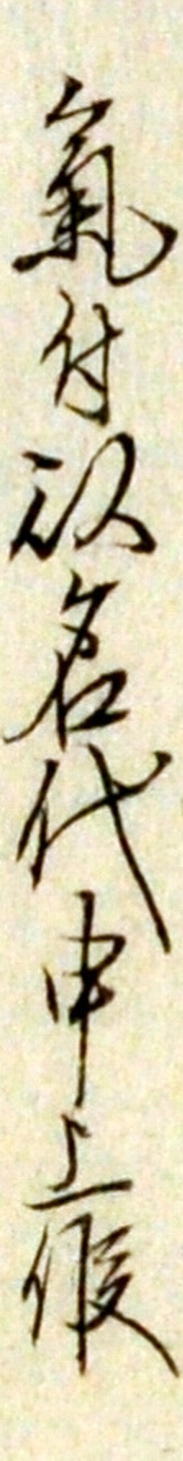気付以名代申上候
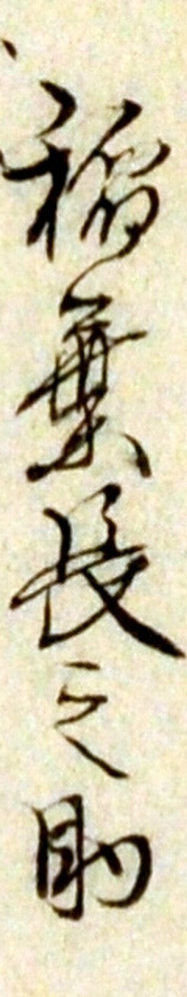稲葉長之助
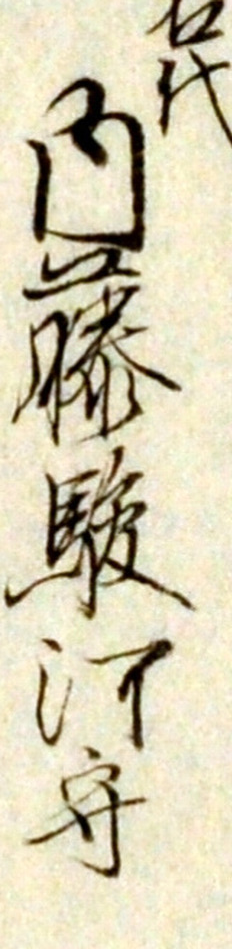内藤駿河守
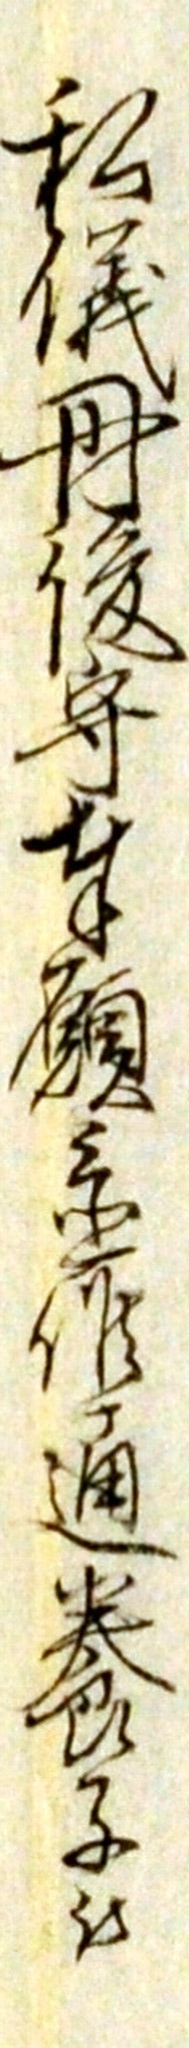私儀丹後守奉願置候通養子被
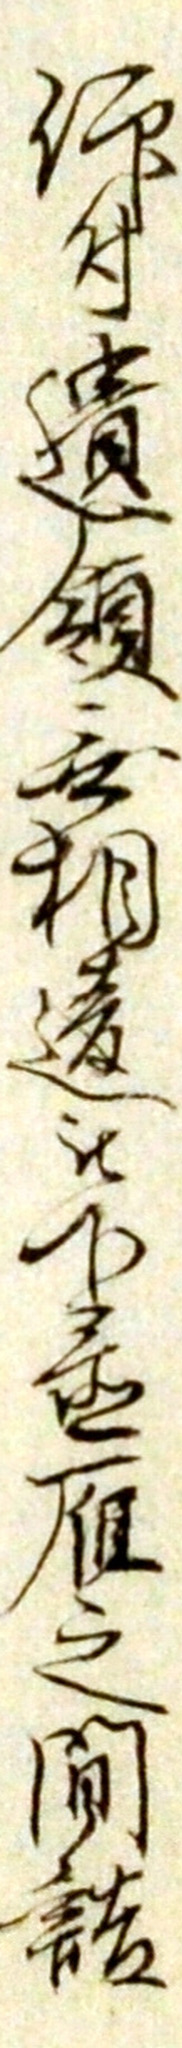仰付遺領無相違被下置雁之間詰

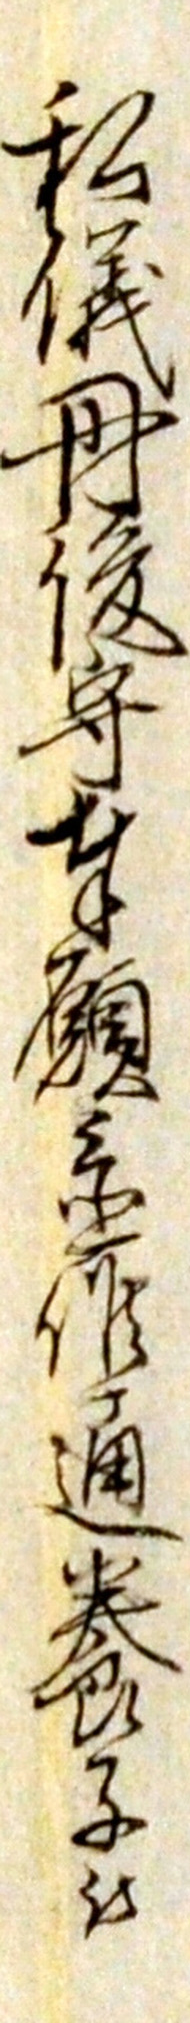拙者儀丹後守奉願置候通養子
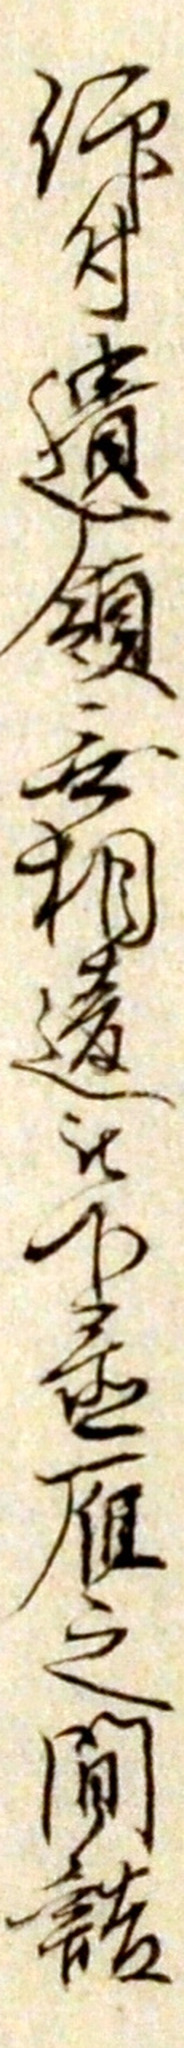被仰付遺領無相違被下置雁之間
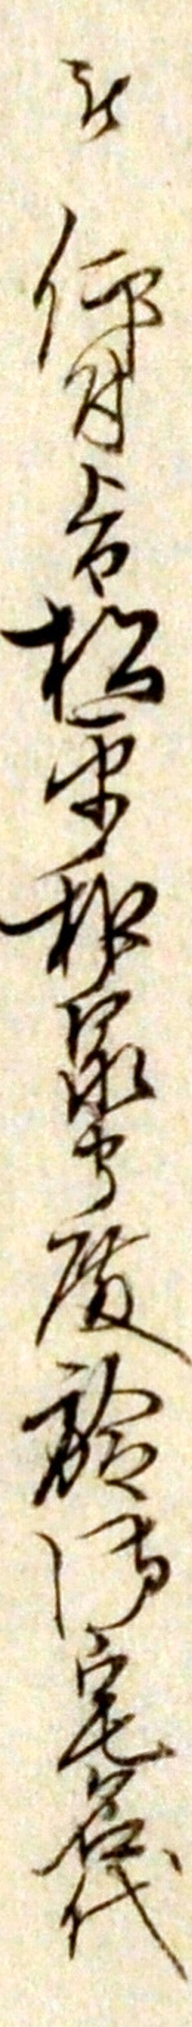詰被仰付旨松平和泉守殿於御宅
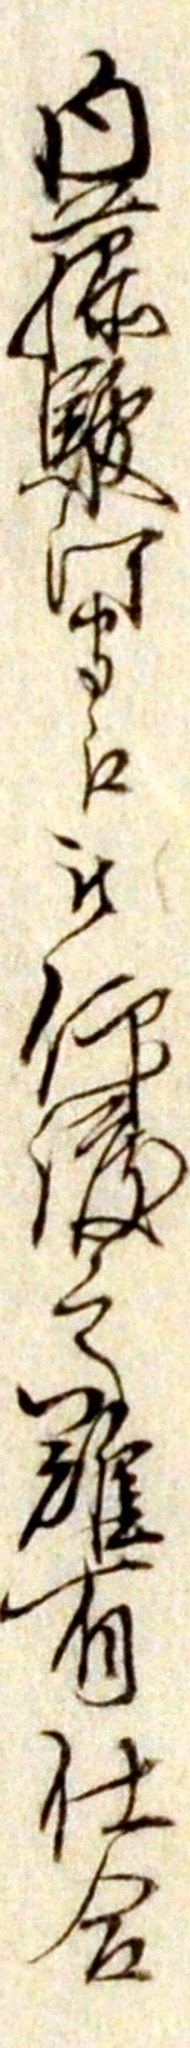名代内藤駿河守え被仰渡之難有
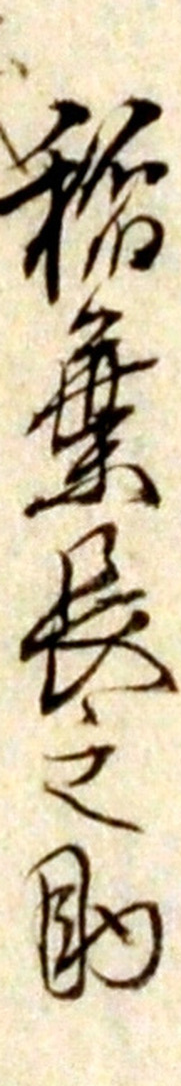稲葉長之助
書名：諸名代相勤候節ノ留書外
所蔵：伊那市立高遠町図書館・合同会社AMANE
